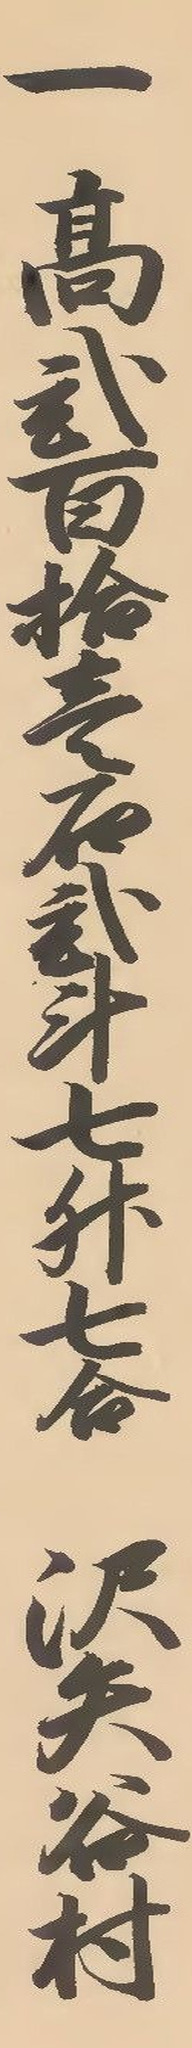一高弐百拾壱石弐斗七升七合沢矢谷村
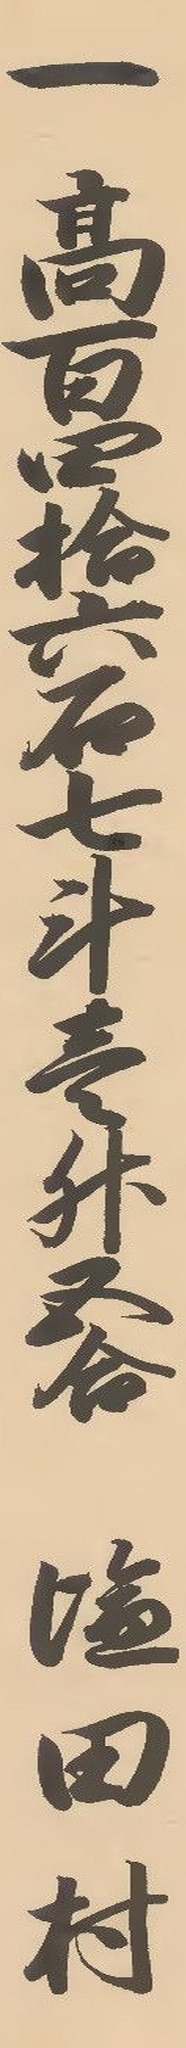一高百四拾六石七斗壱升五合塩田村
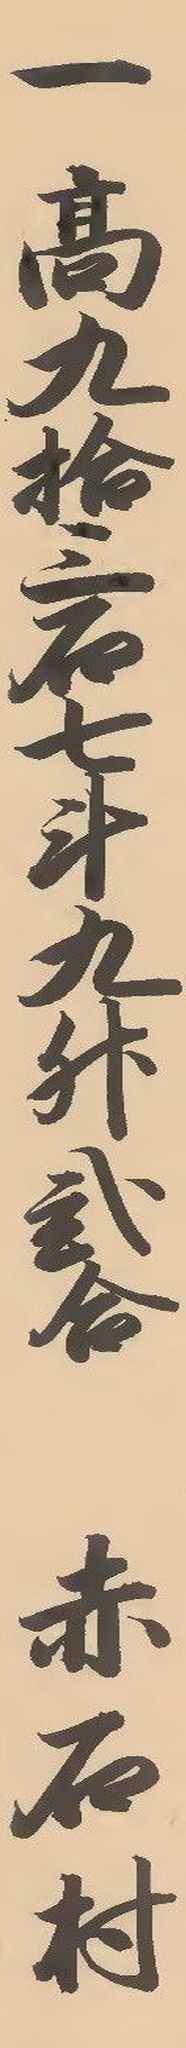一高九拾三石七斗九升弐合赤石村

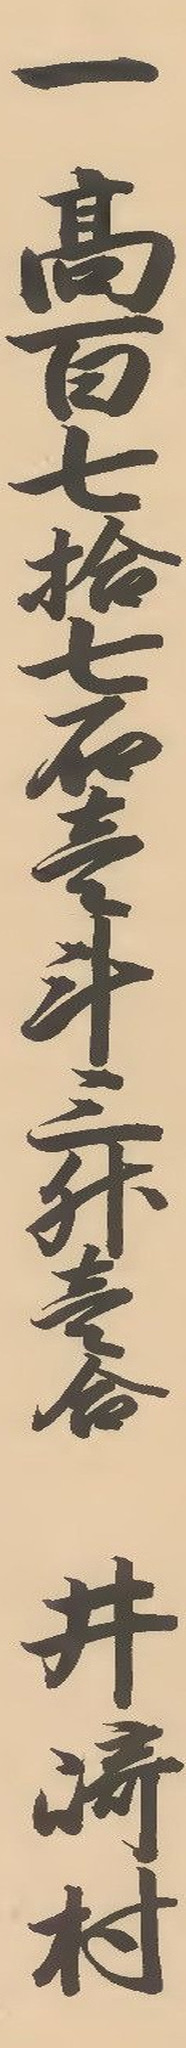一高百七拾七石壱斗三升壱合井崎村
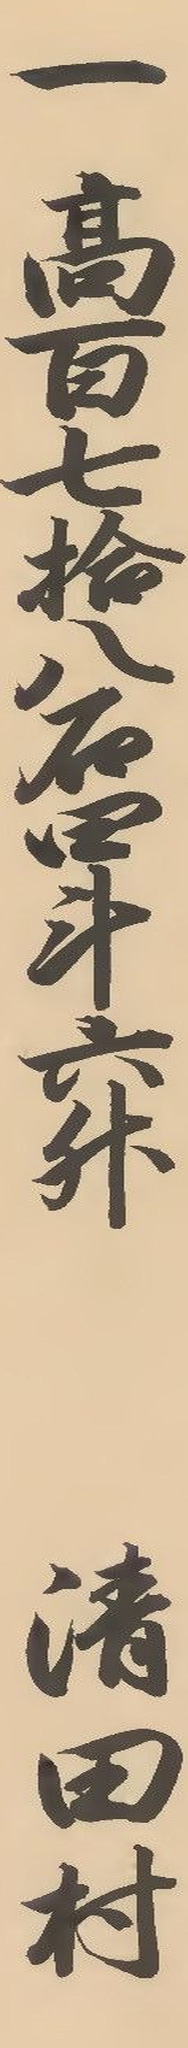一高百七拾八石四斗六升清田村
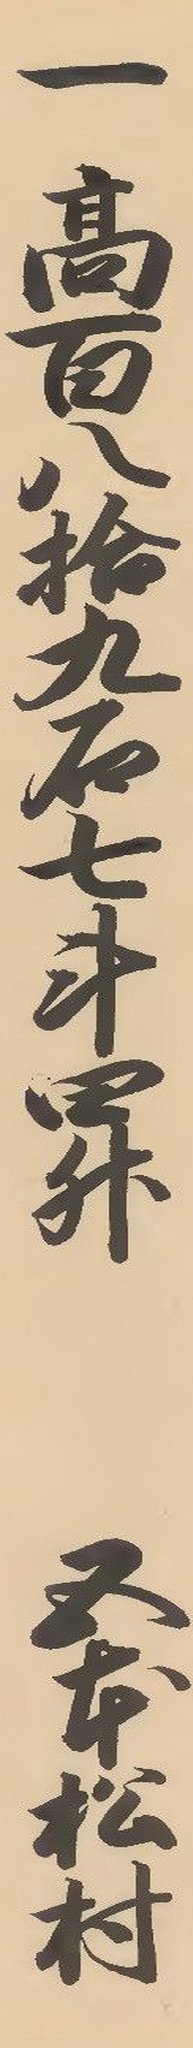一高百八拾九石七斗四升五本松村
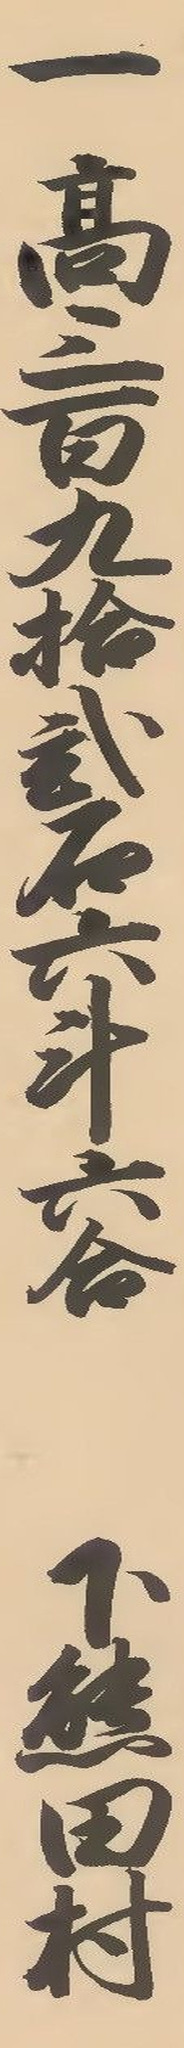一高三百九拾弐石六斗六合下熊田村
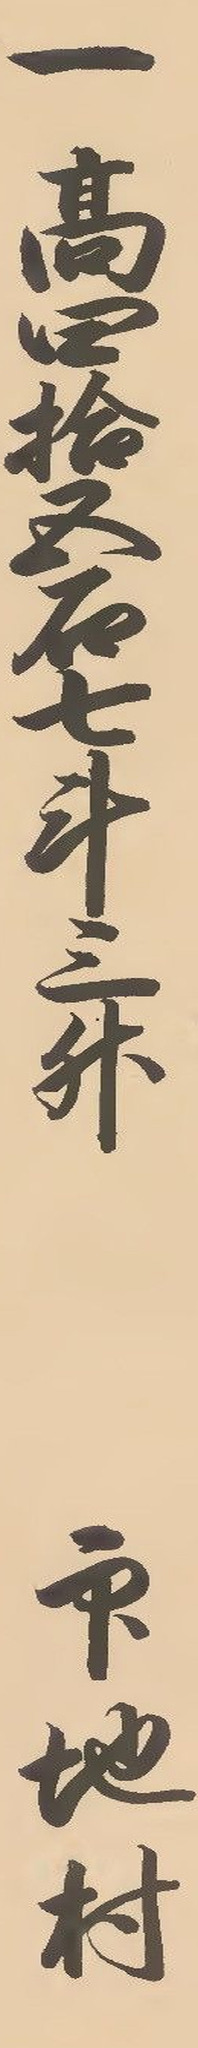一高四拾五石七斗三升印地村
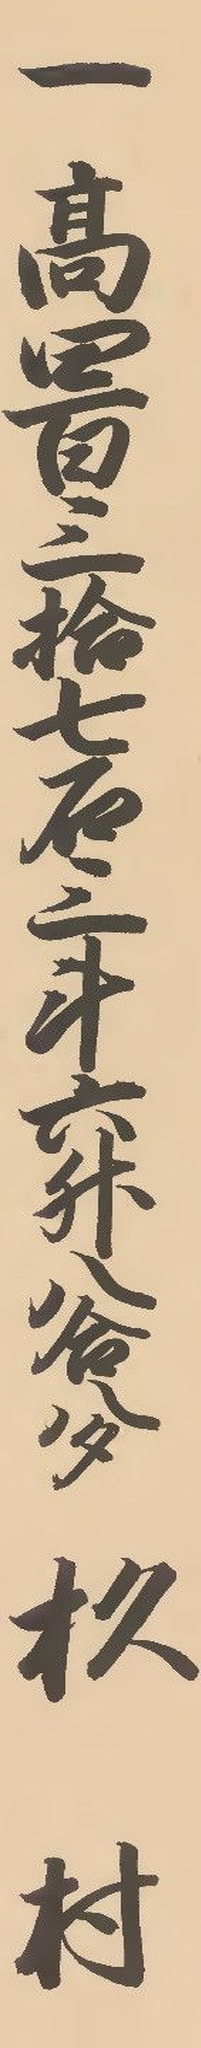一高四百三拾七石三斗六升八合八勺杉村
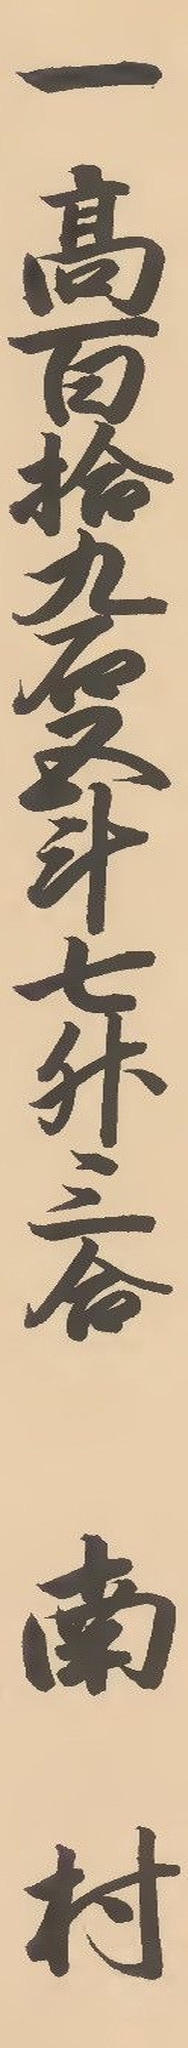一高百拾九石五斗七升三合南村
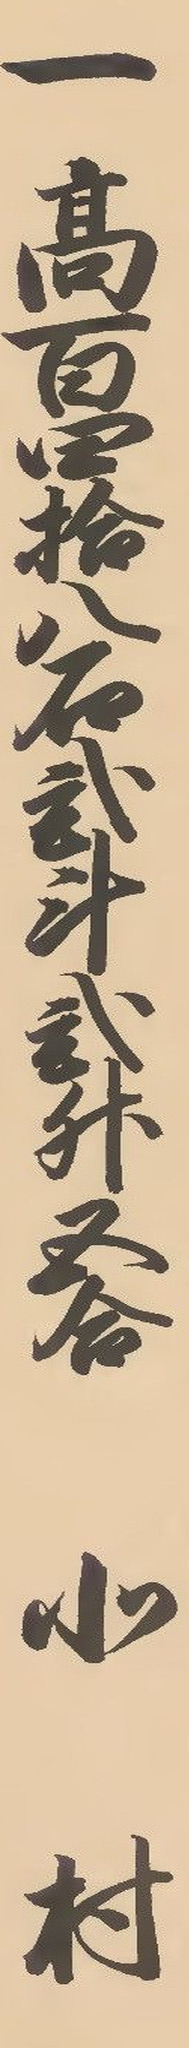一高百四拾八石弐斗弐升五合北村

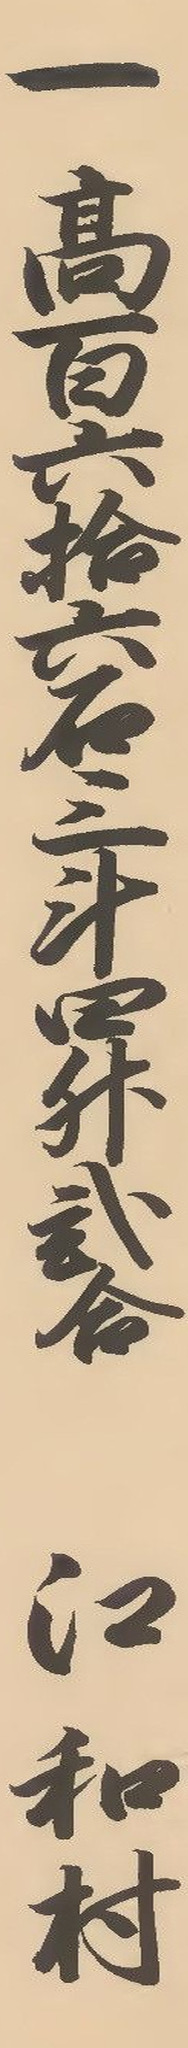一高百六拾六石三斗四升弐合江和村
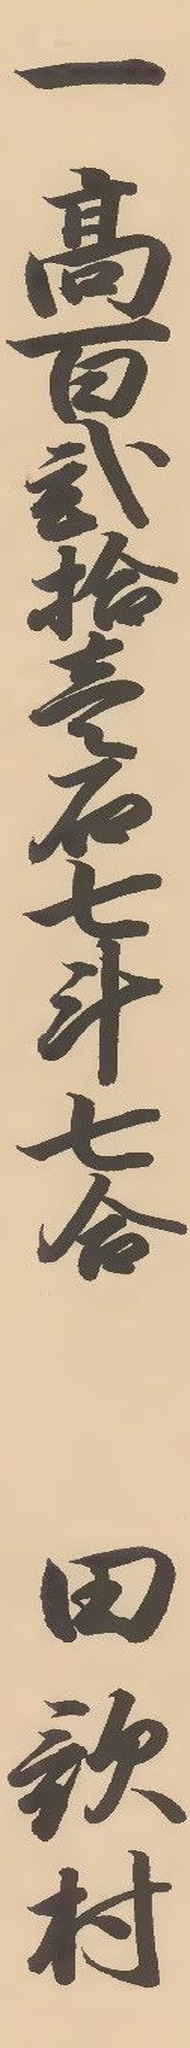一高百弐拾壱石七斗七合田歌村
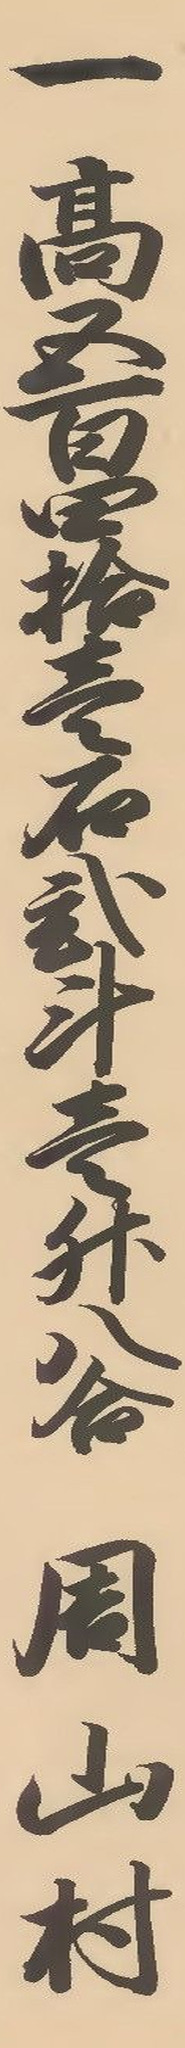一高五百四拾壱石弐斗壱升八合周山村
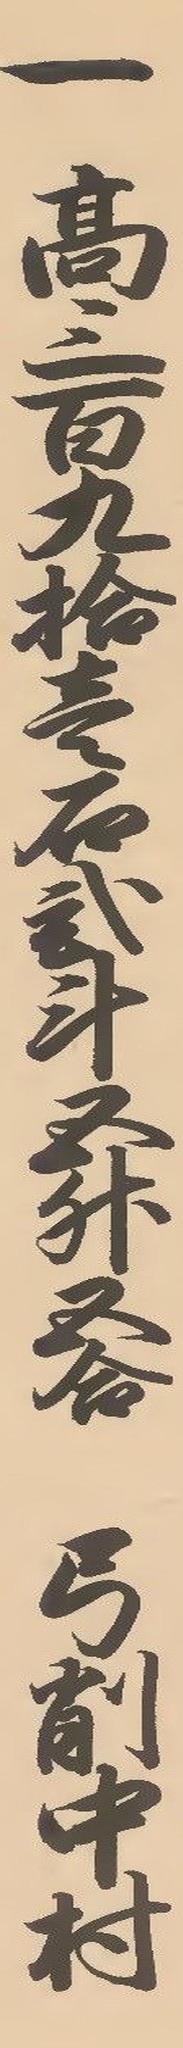一高三百九拾壱石弐斗五升五合弓削中村
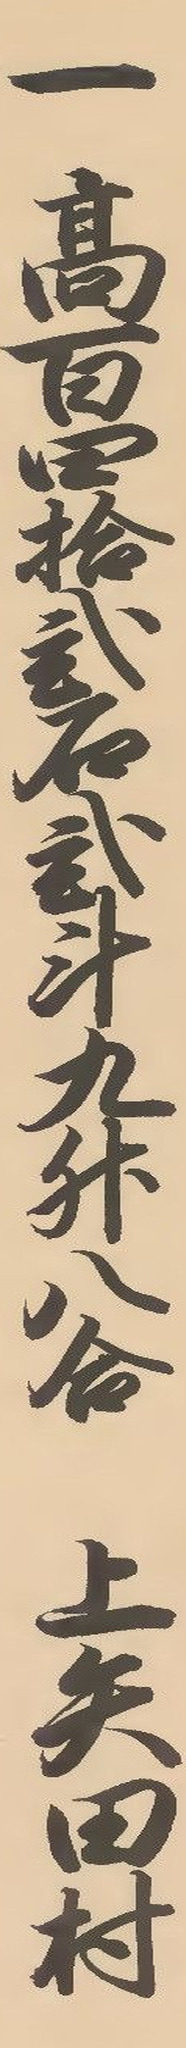一高百四拾弐石弐斗九升八合上矢田村
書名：丹波国郷帳
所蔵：国立公文書館 National Archives of Japan
